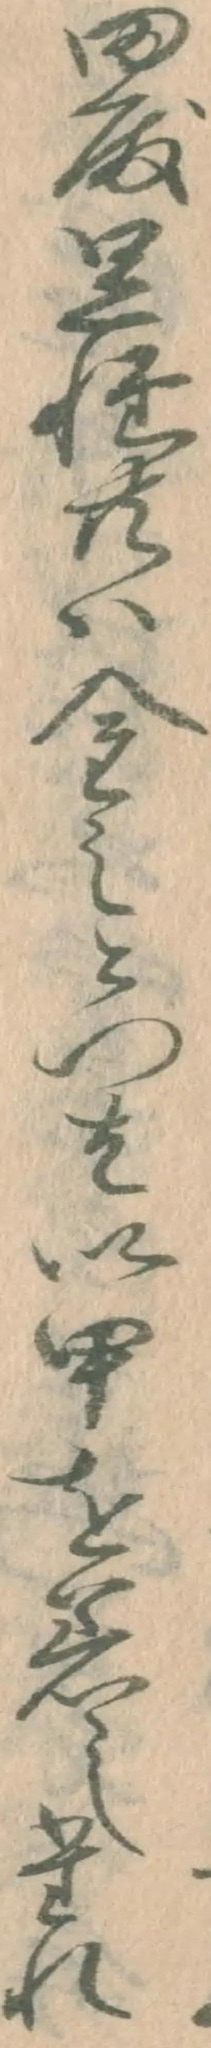田殿足軽共は金之とつ者以甲を着し堂れ

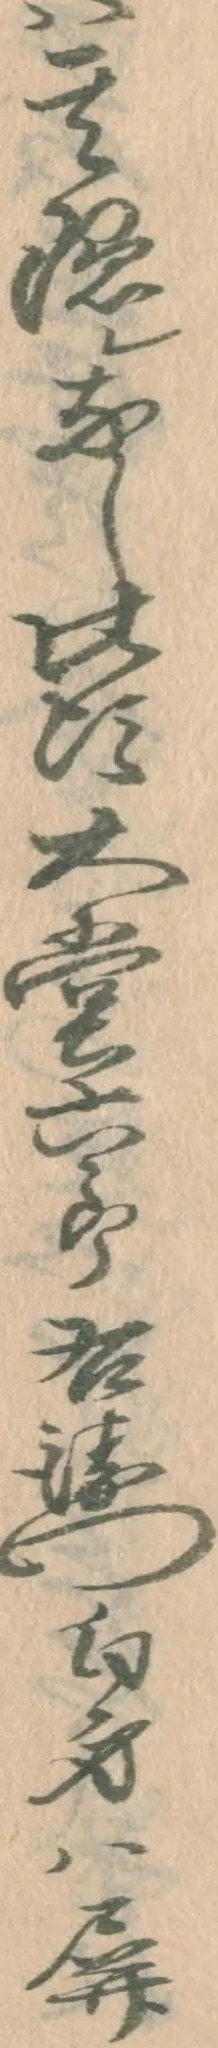は其隠れなし此頭大堂六郎右衛門自身は屏
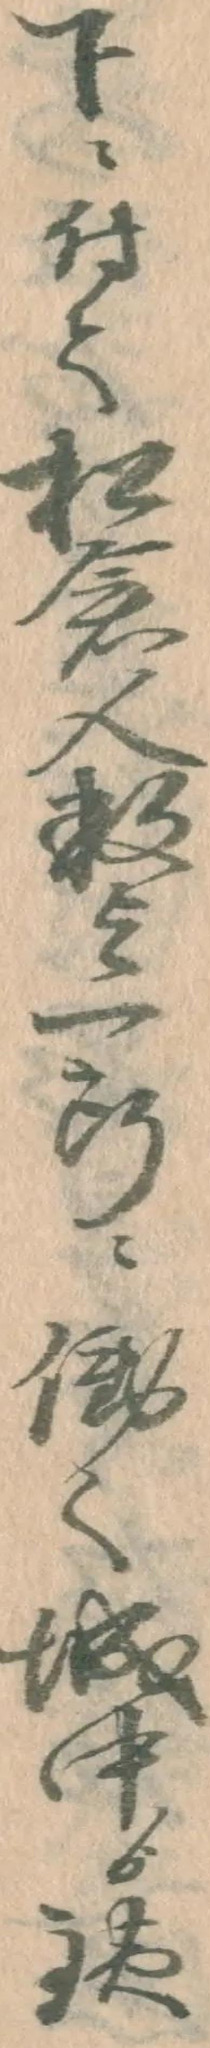下に付て松倉人数与一所に働て城中ゟ鉄
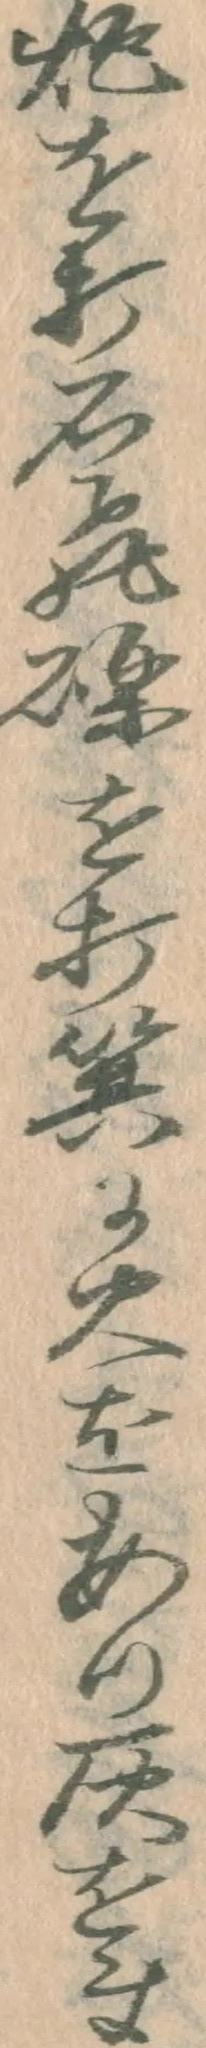炮を打石飛礫を打箕尓火をあ川灰をま
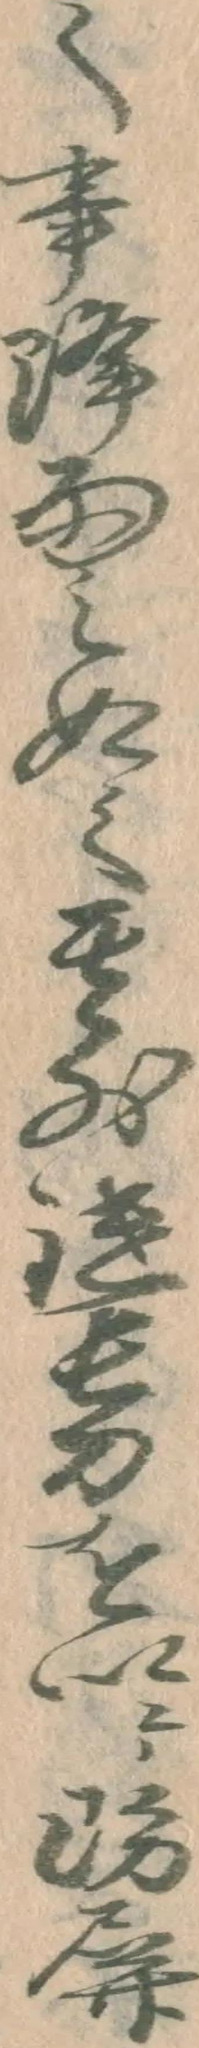く事降雨之如く其外鑓長刀を以て防屏
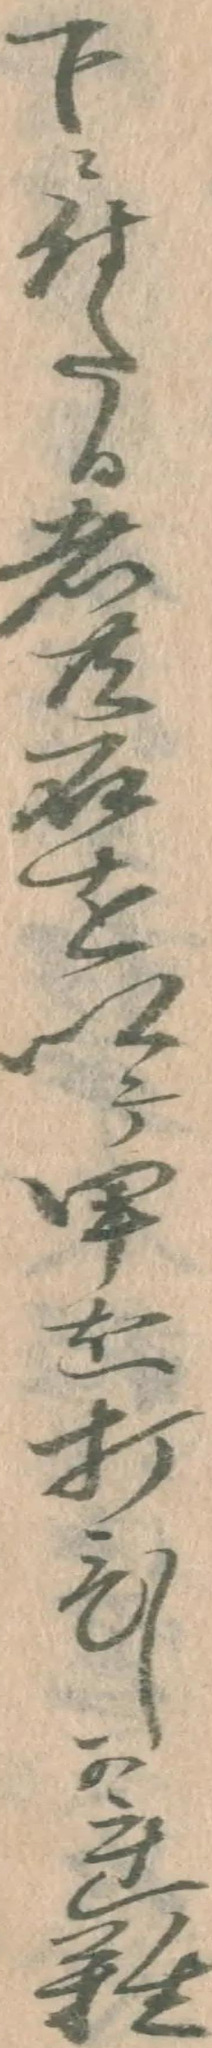下に付たる者共石を以て甲を打ひし可連難
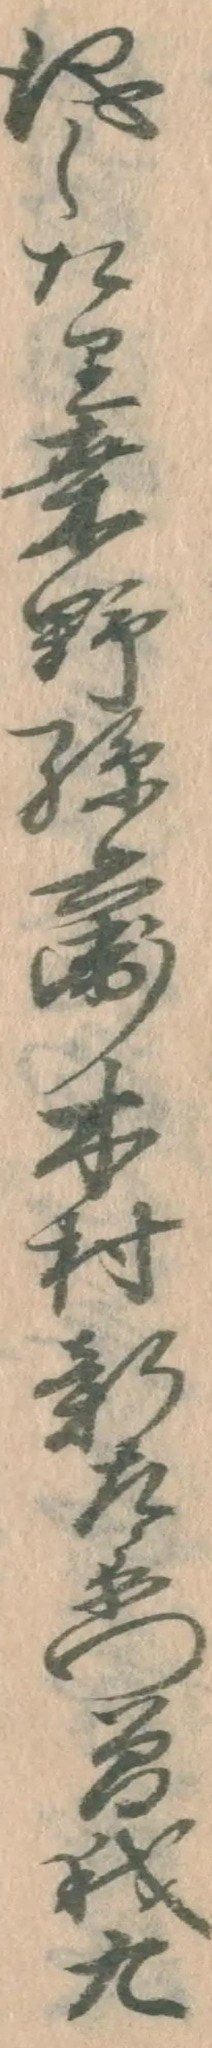儀した里遠野孫兵衛木村新左衛門曽我九
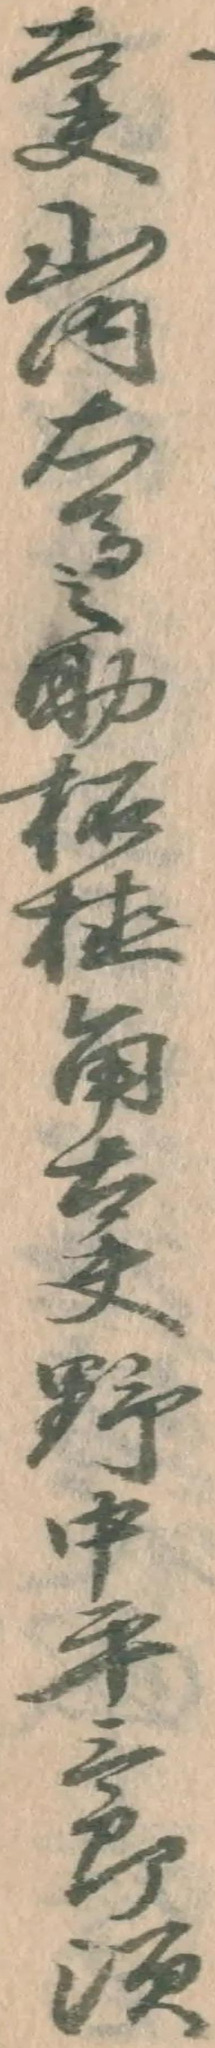太夫山内右馬之助柘植角太夫野中平三郎須
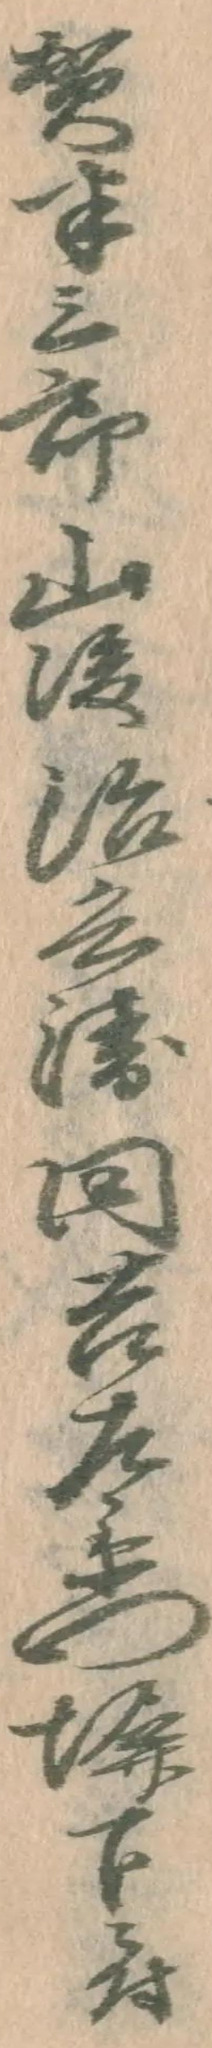賀半三郎山後治兵衛同吉左衛門塀下に付
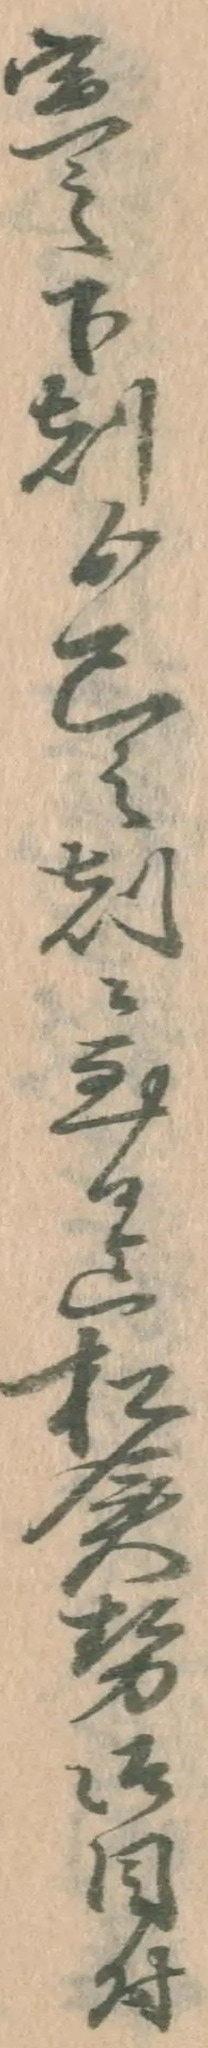寅之下刻ゟ巳之刻に至る迄松倉勢御目付
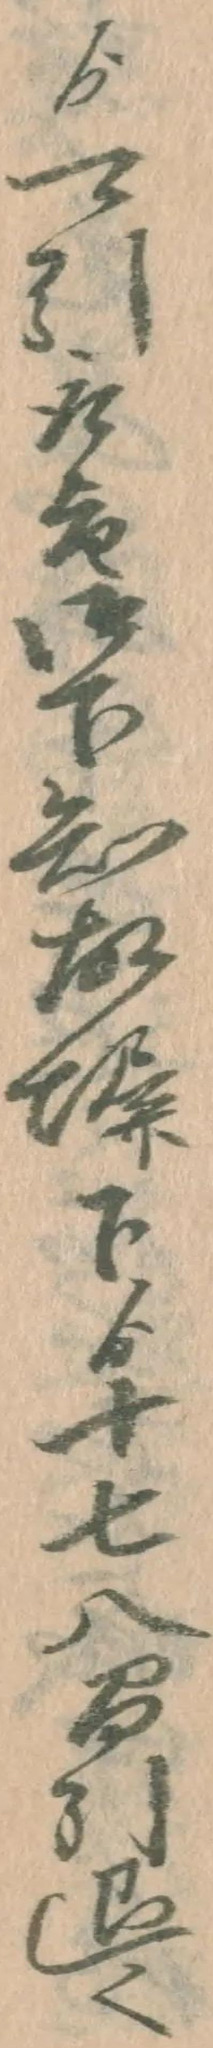ゟ可引取旨御下知故塀下ゟ十七八間引退く
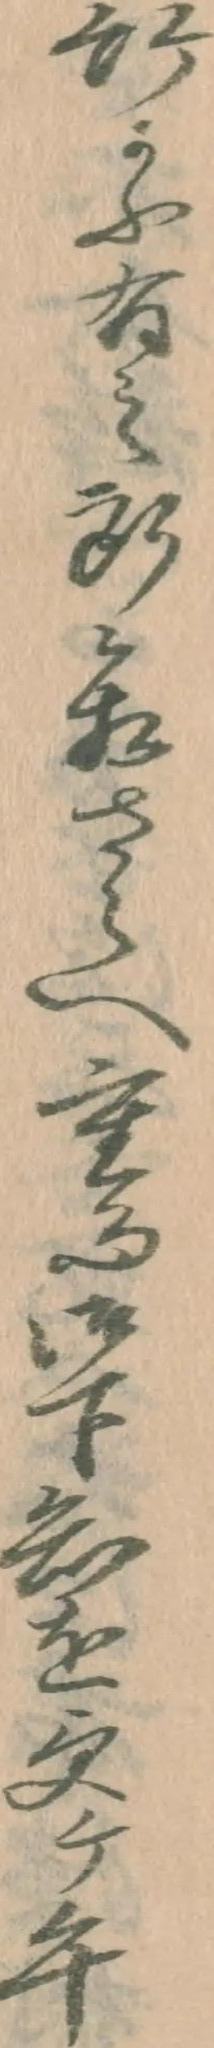竹可ふ有之所に相さらへ重而御下知を受け午
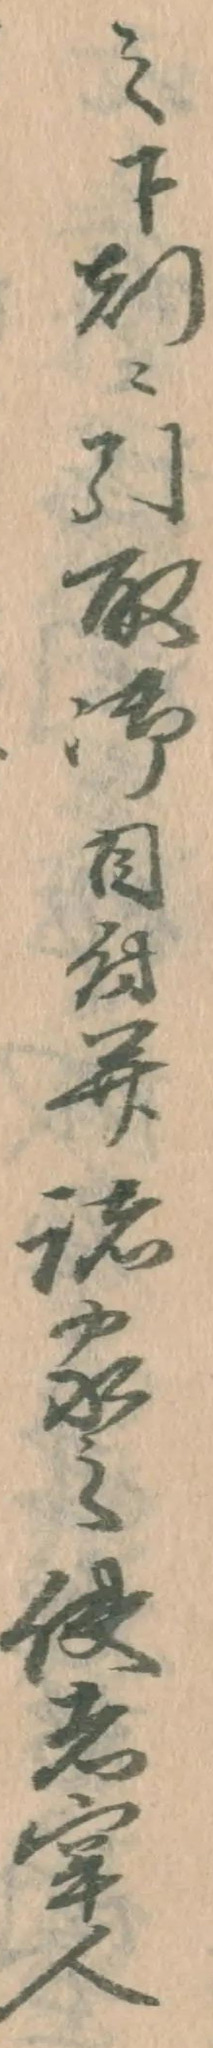之下刻に引取御目付幷諸家之使者牢人
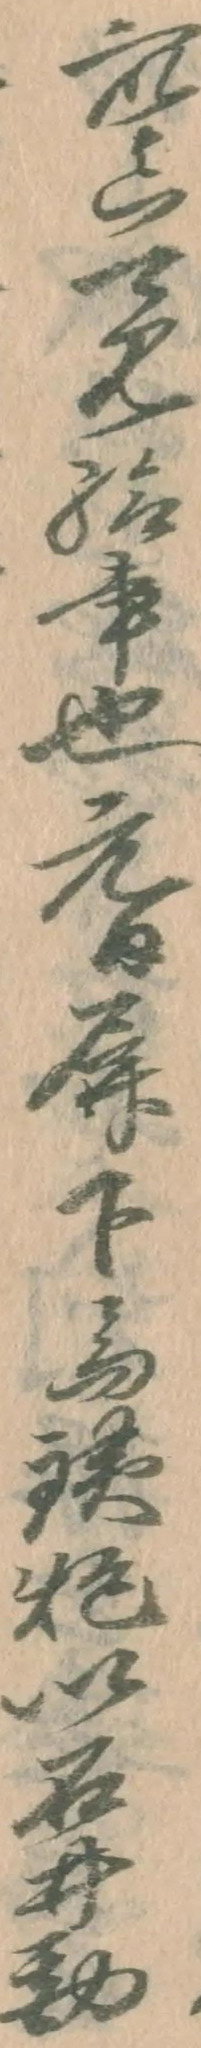衆迄可見給事也元日屏下に而鉄炮以石井勘
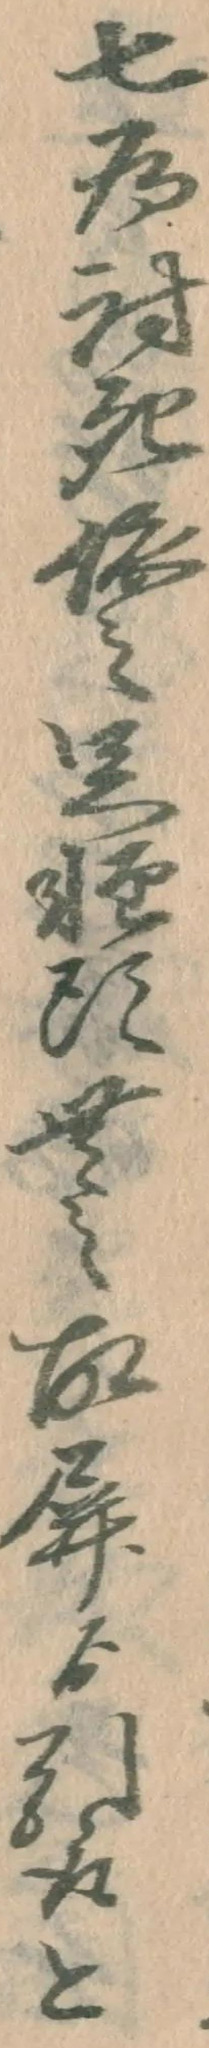七為討死依之足軽頭無之故屏ゟ引取と
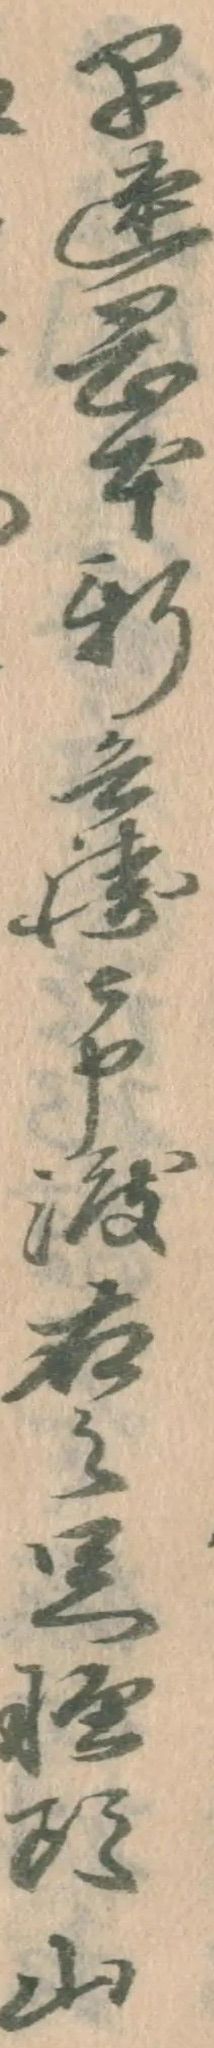早速岡本新兵衛被申渡右之足軽頭山
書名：切支丹御退治記 49巻. [5]
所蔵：国立国会図書館 National Diet Library, JAPAN
